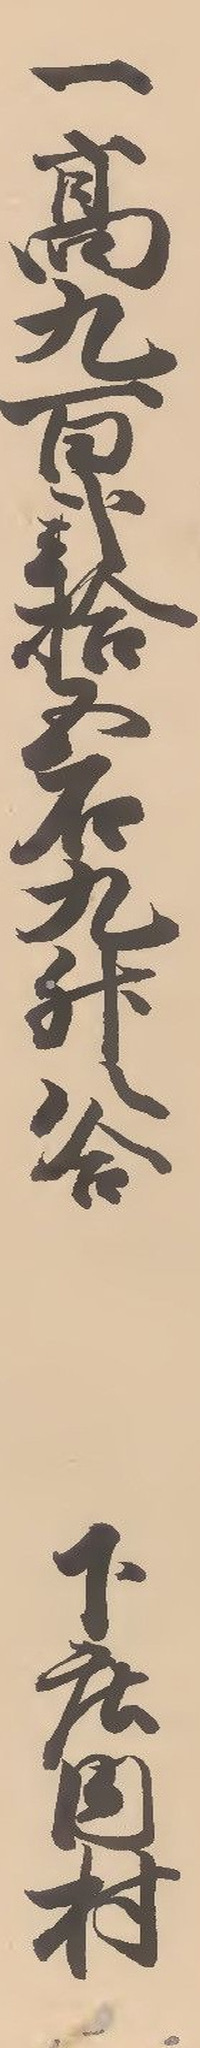一高九百弐拾五石九升八合下庄内村
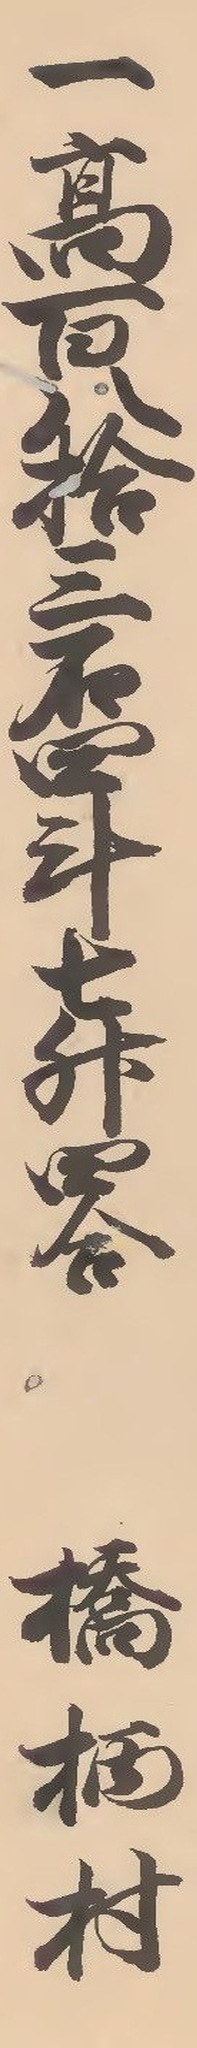一高百八拾三石四斗七升四合橋柄村

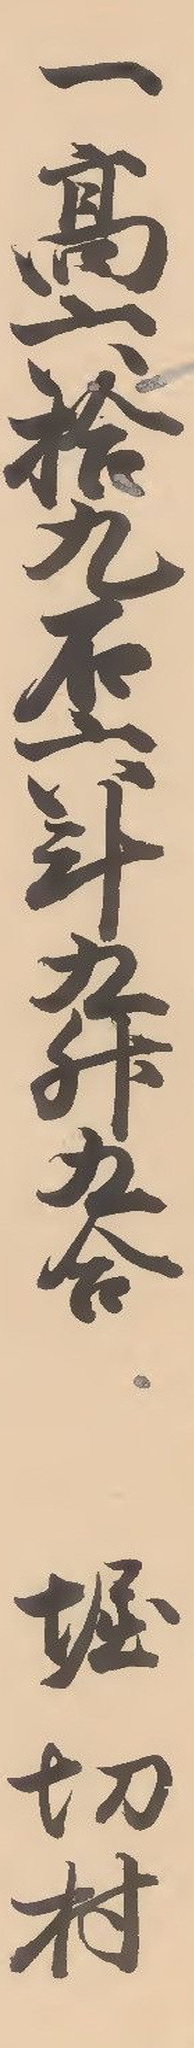一高六拾九石六斗九升九合堀切村
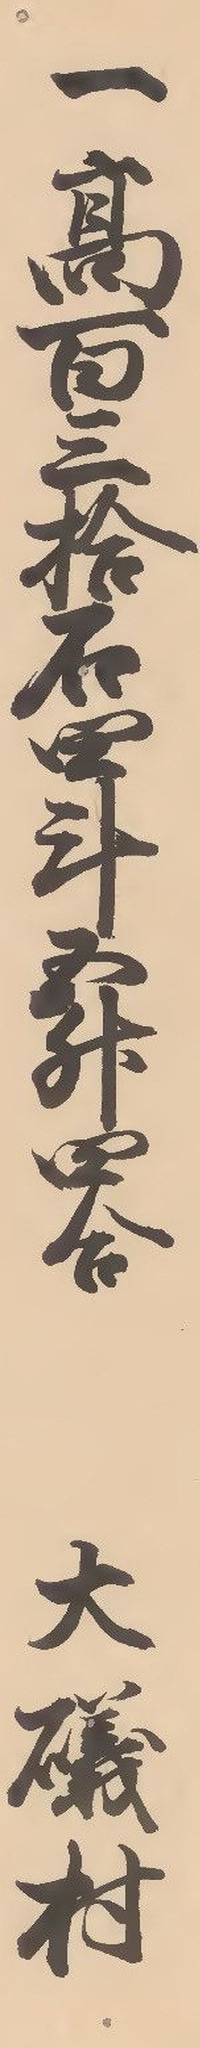一高百三拾石四斗五升四合大磯村
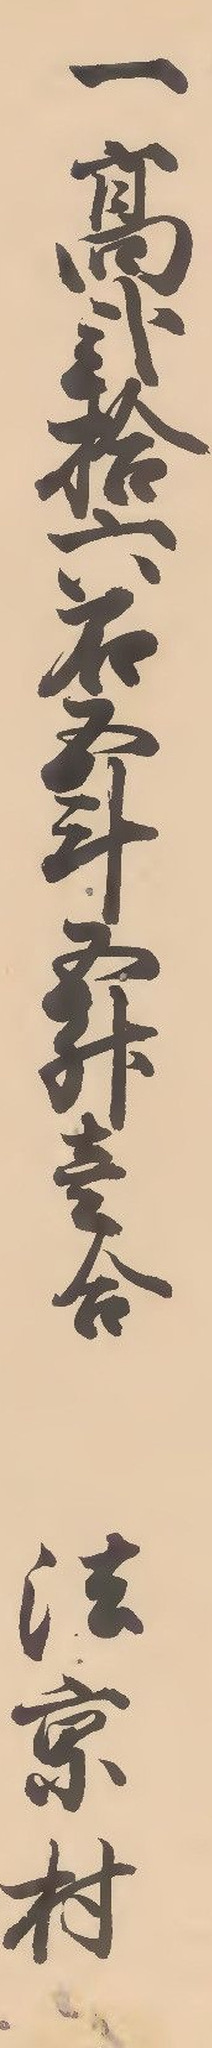一高弐拾六石五斗五升壱合法京村
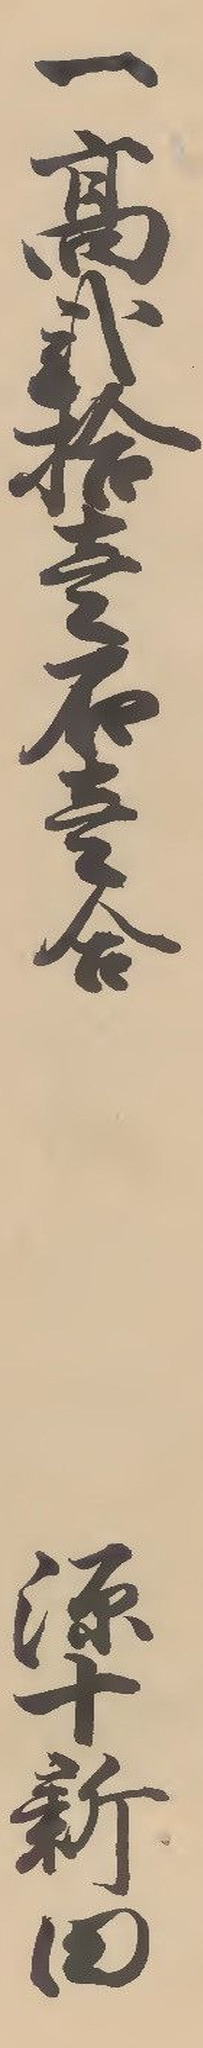一高弐拾壱石壱合源十新田
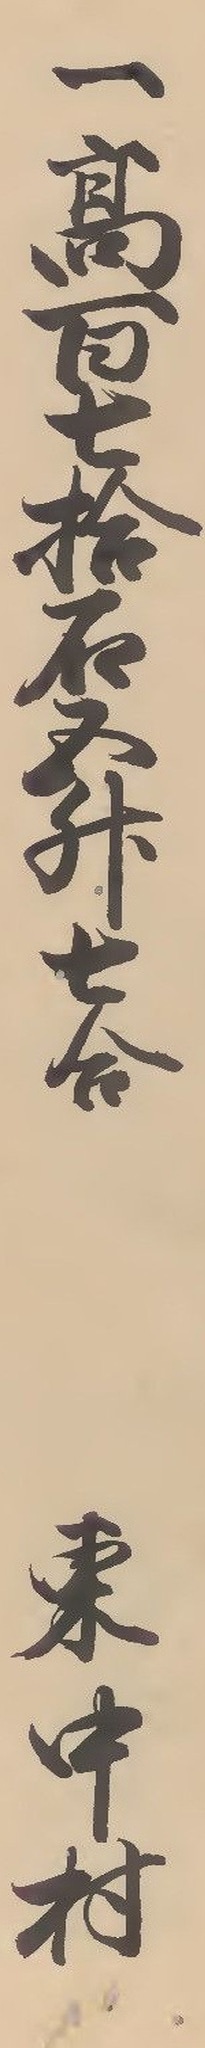一高百七拾石五升七合東中村
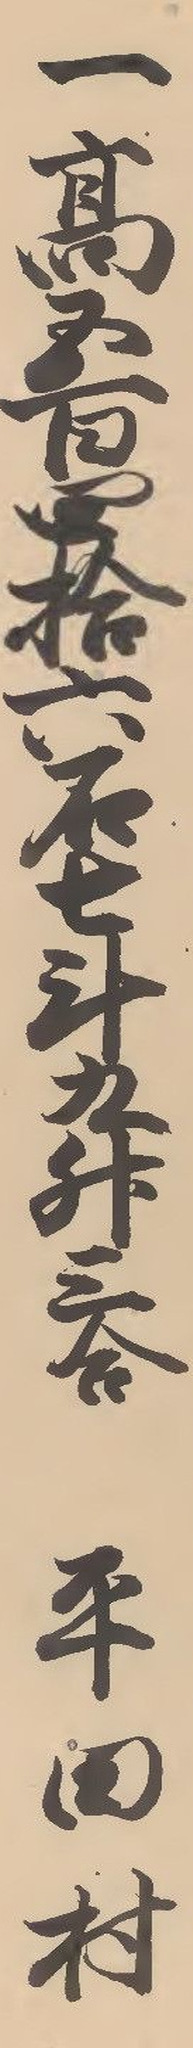一高五百四拾六石七斗九升三合平田村
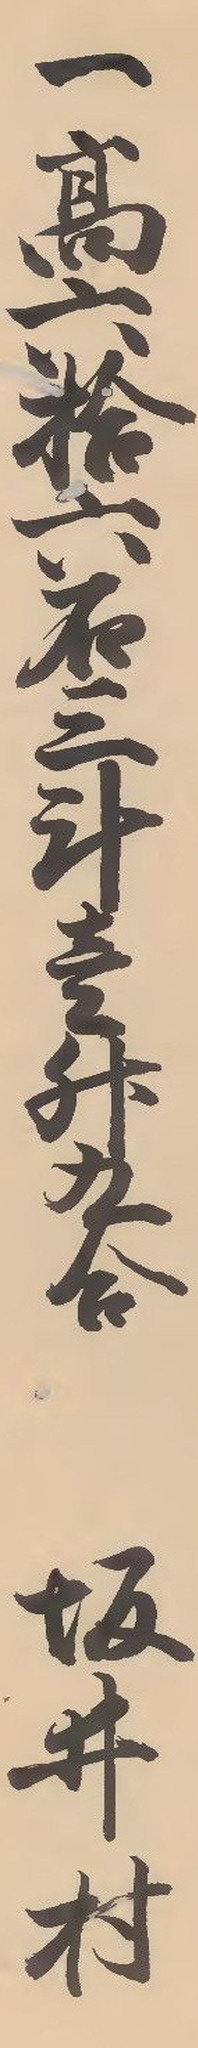一高六拾六石三斗壱升九合坂井村

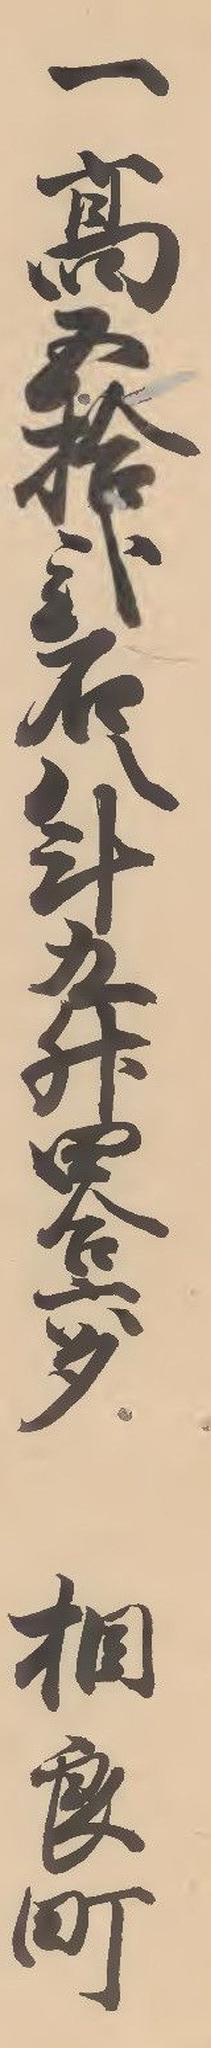一高五拾弐石八斗九升四合六勺相良町
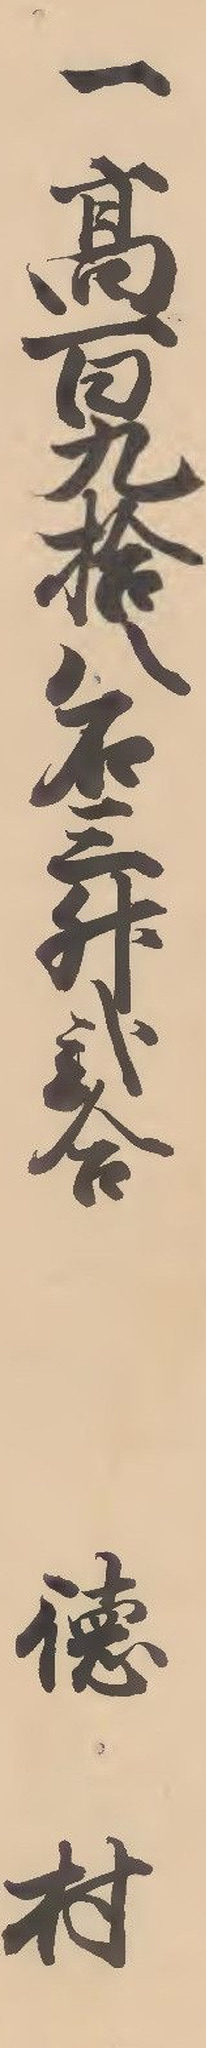一高百九拾八石三升弐合徳村
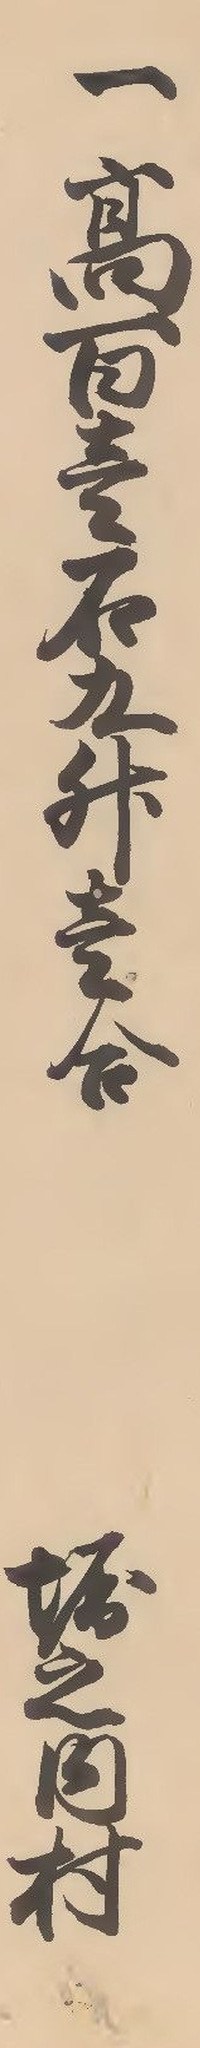一高百壱石九升壱合堀之内村
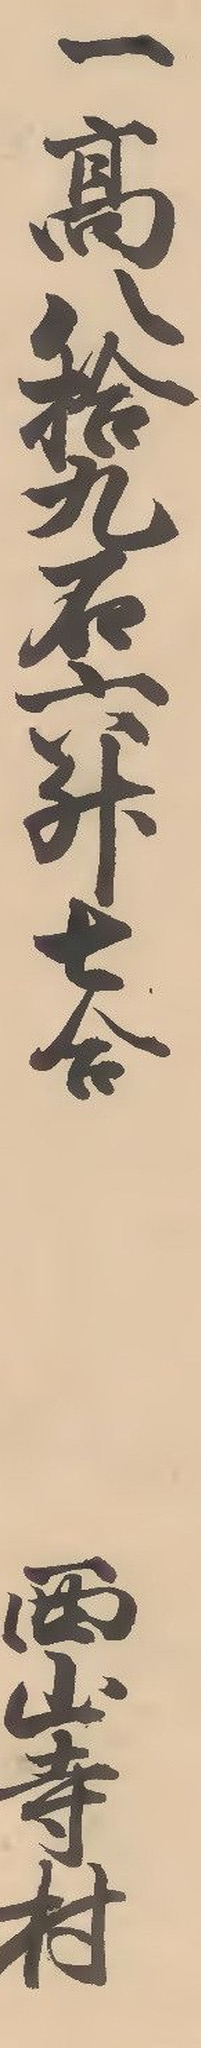一高八拾九石六升七合西山寺村
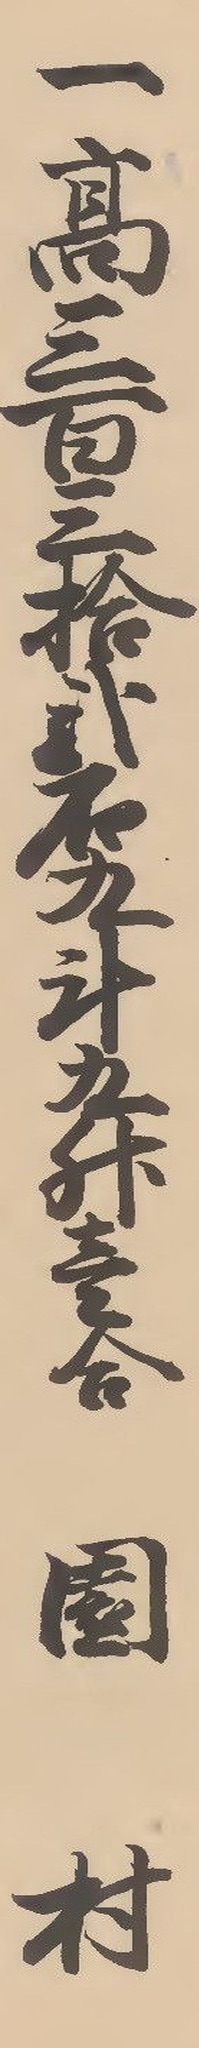一高三百三拾弐石九斗九升壱合園村
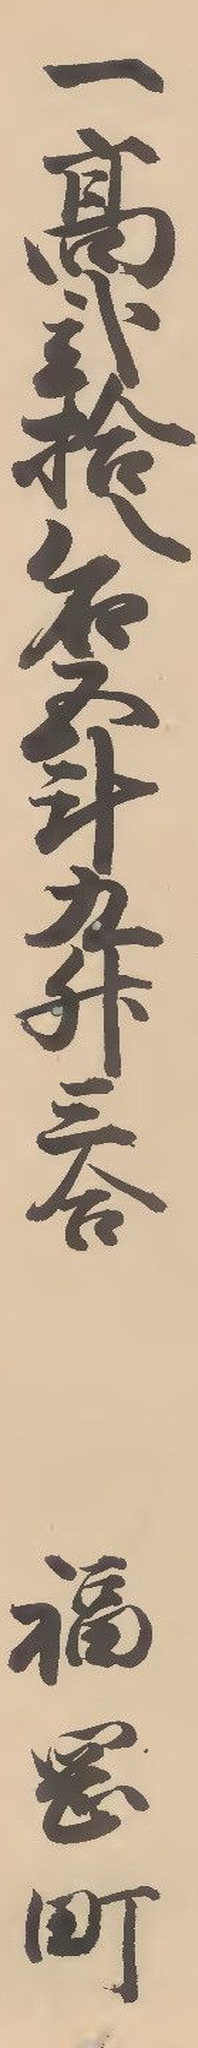一高弐拾八石五斗九升三合福岡町
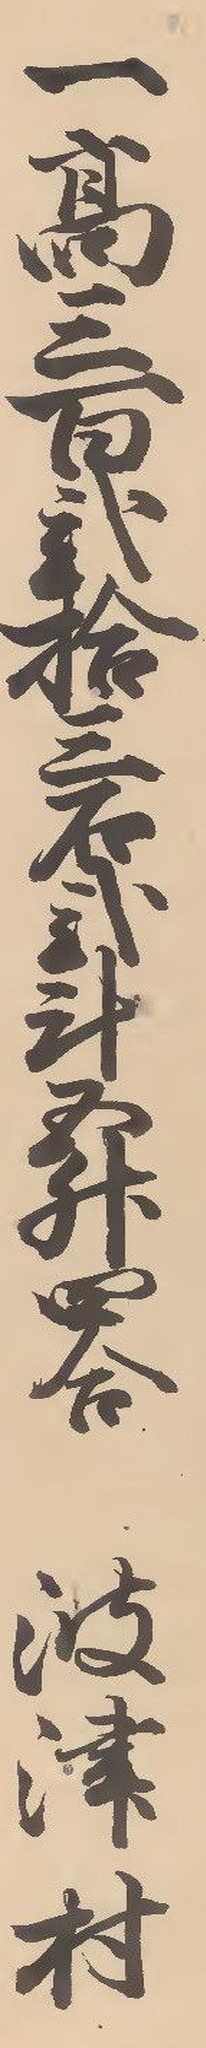一高三百弐拾三石弐斗五升四合波津村
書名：遠江国郷帳
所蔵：国立公文書館 National Archives of Japan
